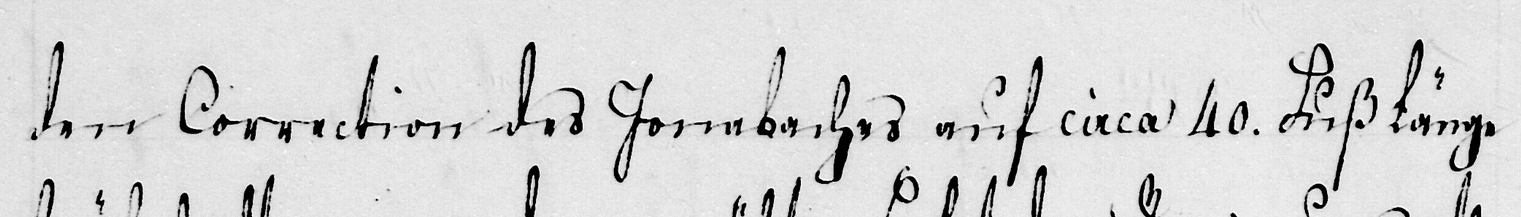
den Correction des Jonabaches auf circa 40. Fuß Länge
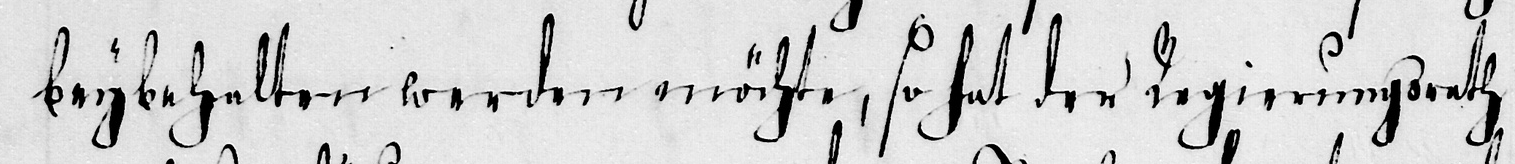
beybehalten werden möchte, so hat der Regierungsrath
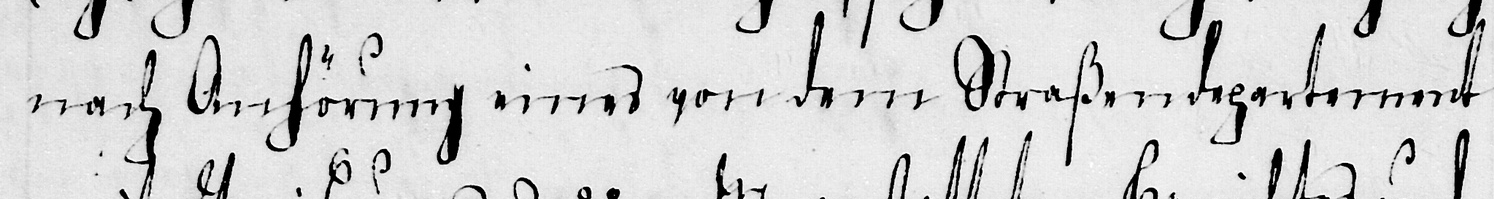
nach Anhörung eines von dem Straßendepartement
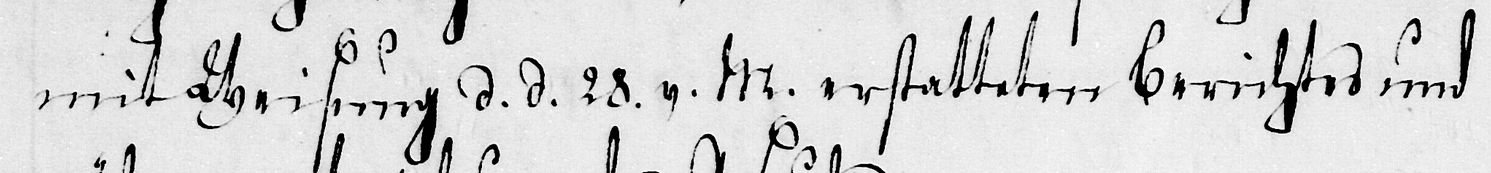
mit Weisung d. d. 28. v. M. erstatteten Berichtes und
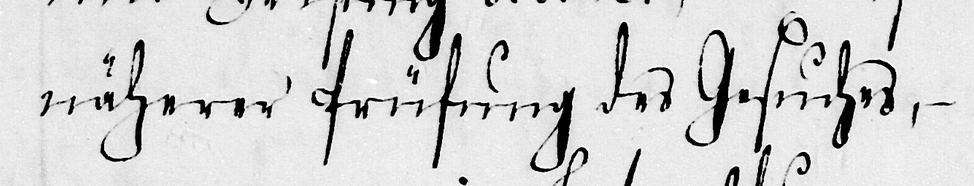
näherer Prüfung des Gesuches,
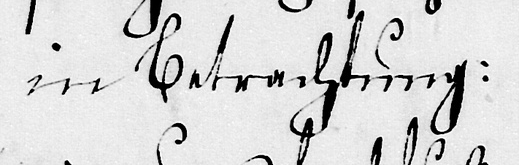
in Betrachtung:
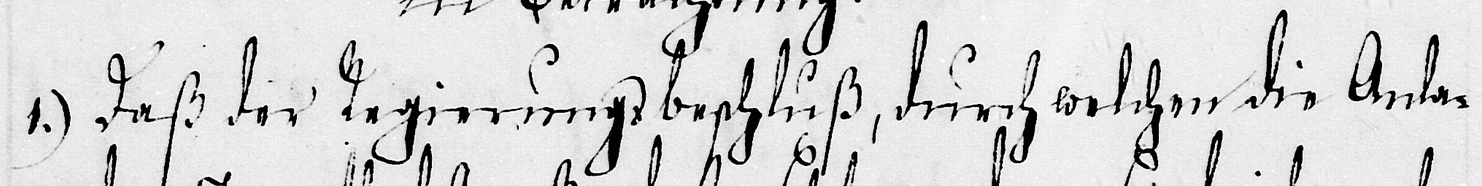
1.) Daß der Regierungsbeschluß, durch welchen die Anla¬
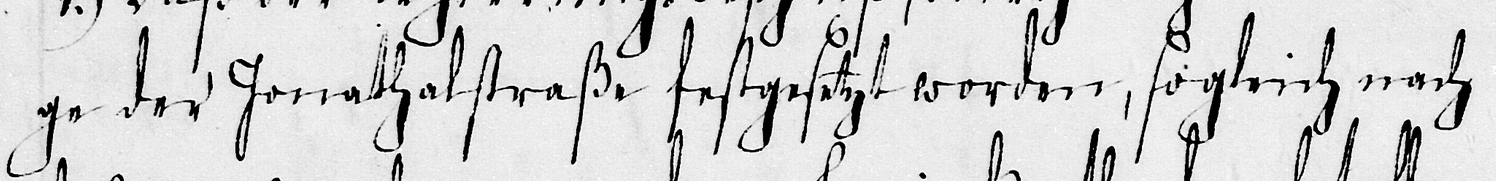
ge der Jonathalstraße festgesetzt worden, sogleich nach
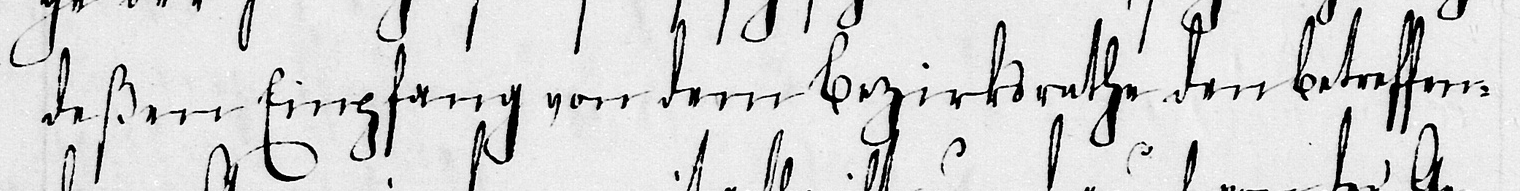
deßen Empfang von dem Bezirksrathe den betreffen¬
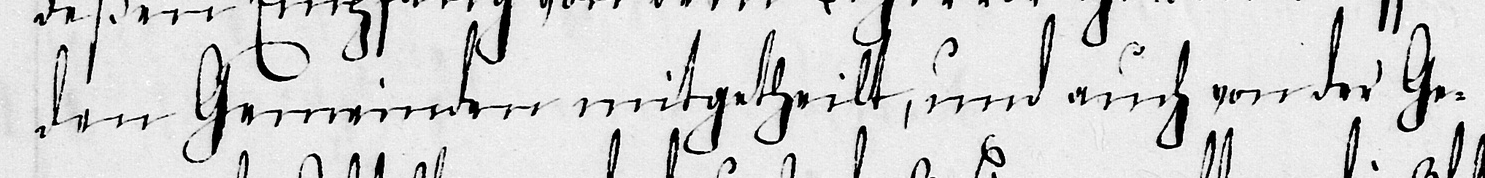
den Gemeinden mitgetheilt, und auch von der Ge¬
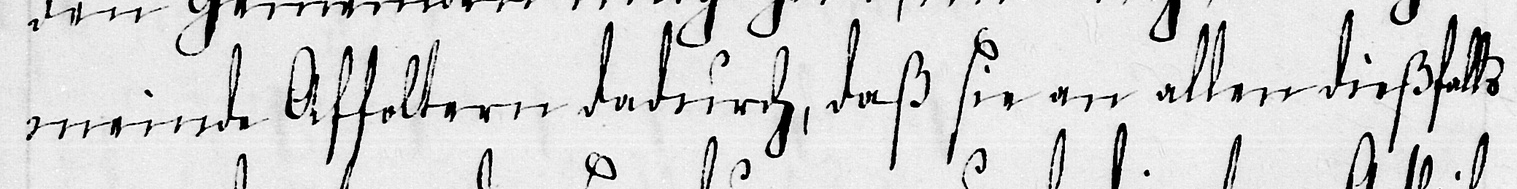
meinde Affoltern dadurch, daß sie an allen dießfal¬
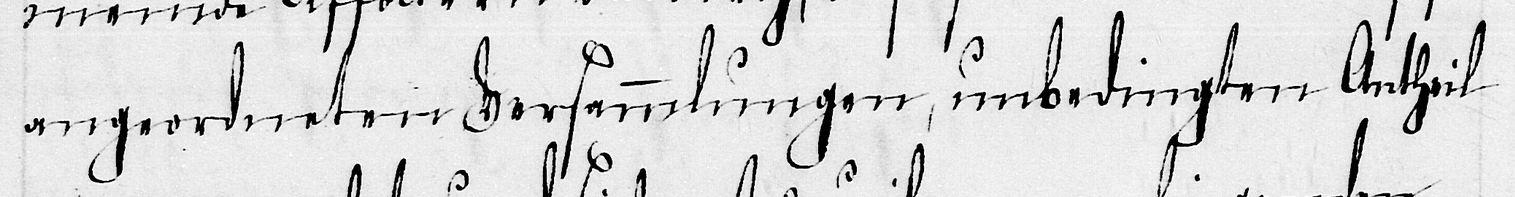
angeordneten Versammlungen, unbedingten Antheil
